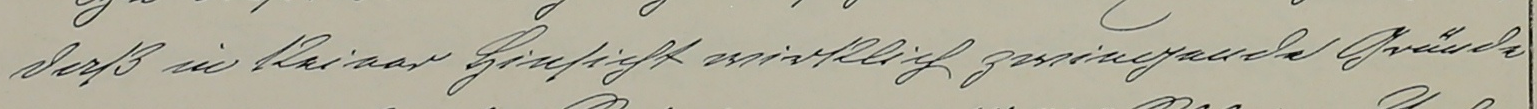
daß in keiner Hinsicht wirklich zwingende Gründe
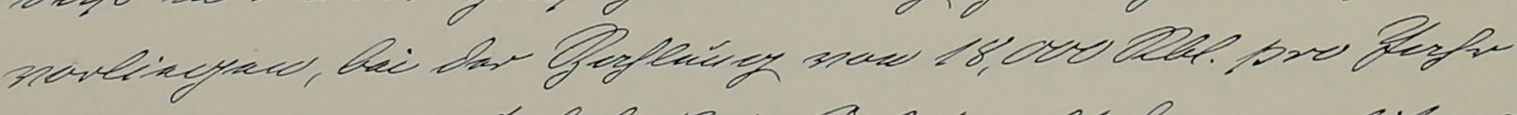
vorliegen, bei der Zahlung von 18.000 Rbl. pro Jahr
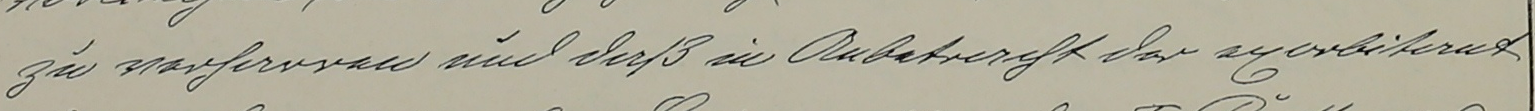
zu verharren und daß in Anbetracht der exorbitant
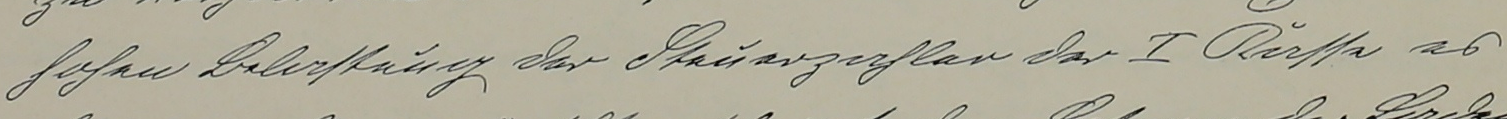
hohen Belastung der Steuerzahler der I Kasse es
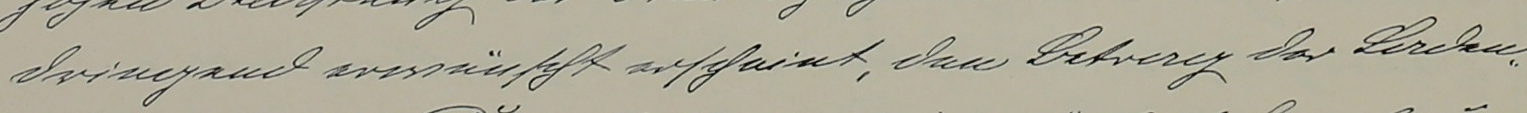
dringend erwünscht erscheint, den Betrag der Laden-
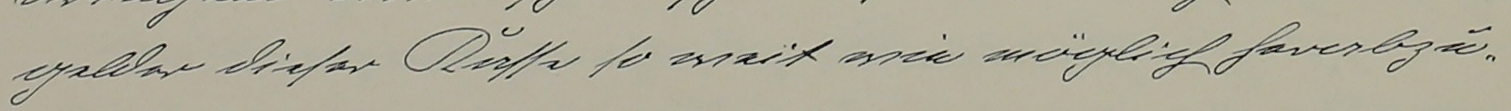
gelder dieser Kasse so weit wie möglich herabzu-
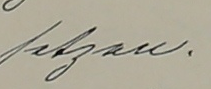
setzen.
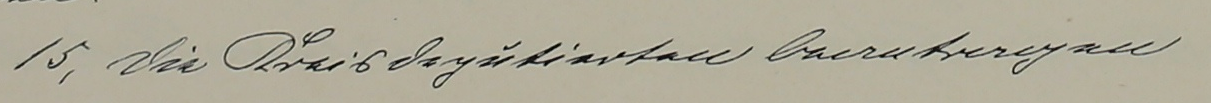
15. Die Kreisdeputierten beantragen
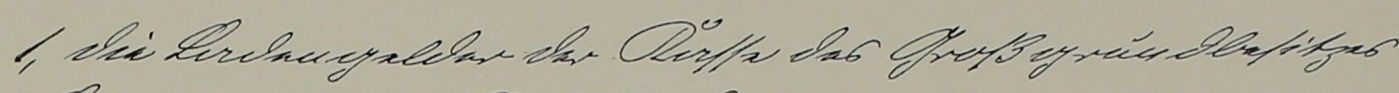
1. Die Ladengelder der Kasse des Großgrundbesitzes
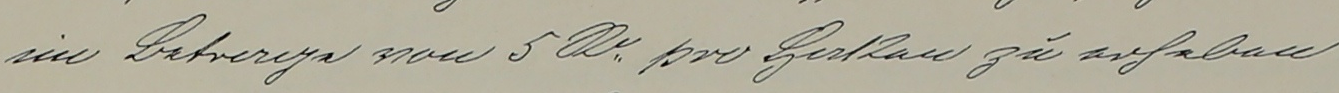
im Betrage von 5 Ro. pro Haken zu erheben
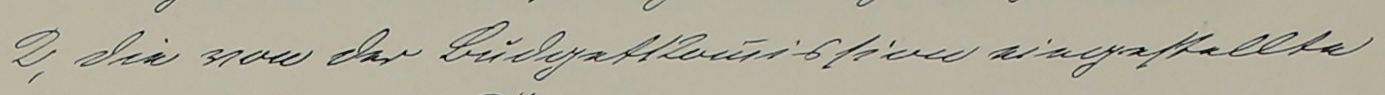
2. die von der Budgetkommission eingestellte
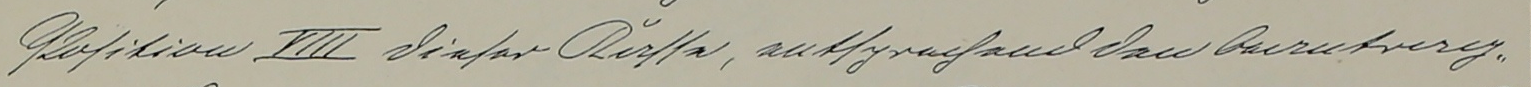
Position VIII dieser Kasse, entsprechend den beantrag-
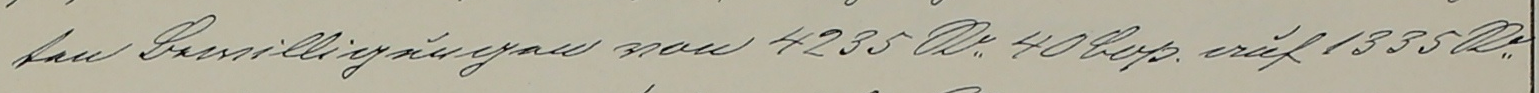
ten Bewilligungen von 4235 Ro. 40 Cop. auf 1335 Ro.
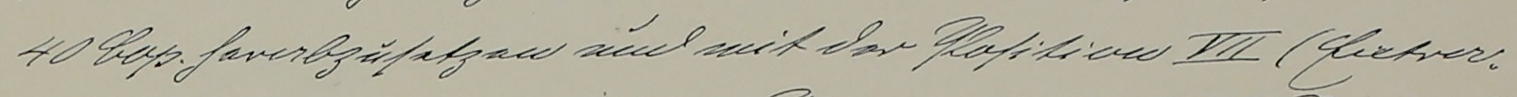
40 Cop. herabzusetzen und mit der Position VII (Extra-
